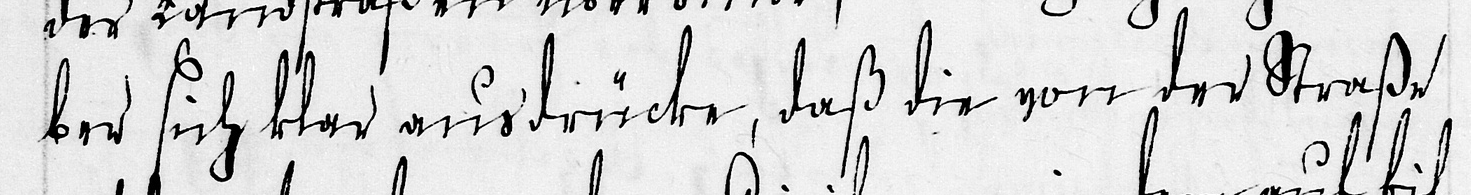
ber sich klar ausdrücke, daß die von der Straße
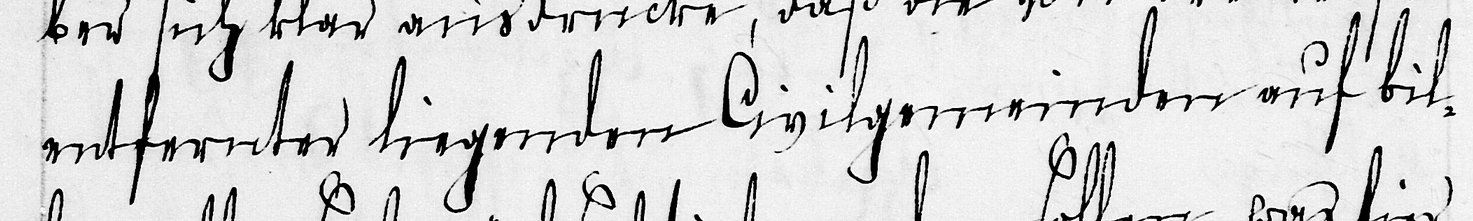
entfernter liegenden Civilgemeinden auf bil¬
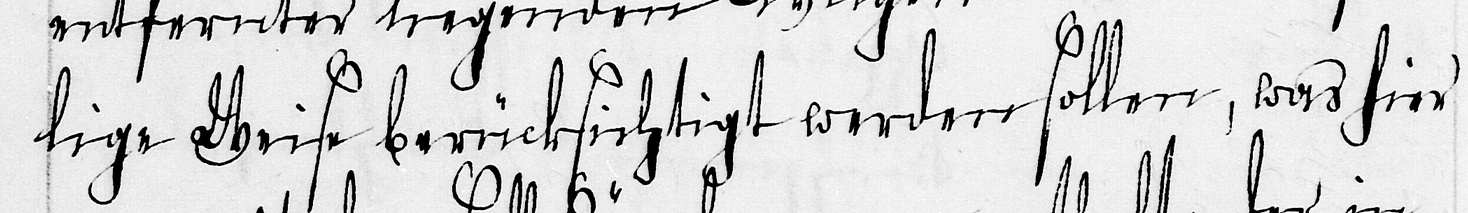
lige Weise berücksichtigt werden sollen, was hier
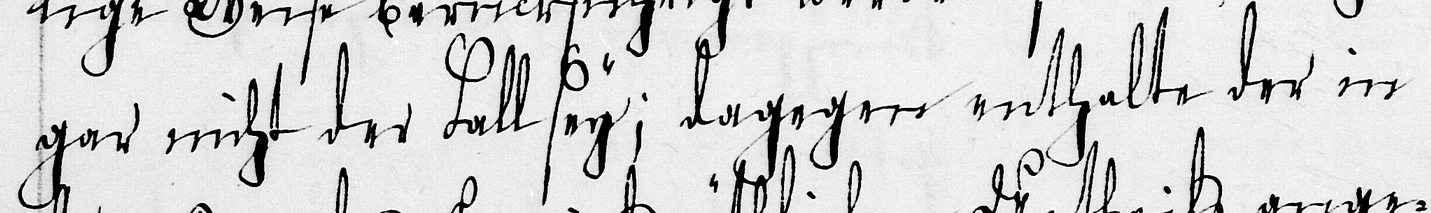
gar nicht der Fall sey; dagegen enthalte der in
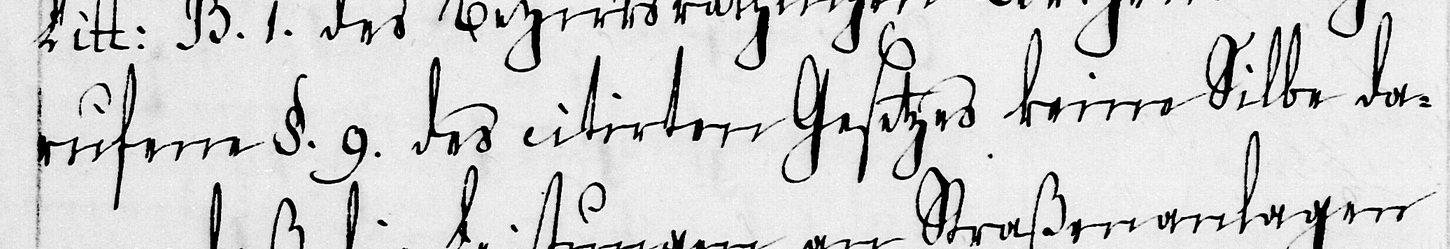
rufene §. 9 des citirten Gesetzes keine Silbe da¬
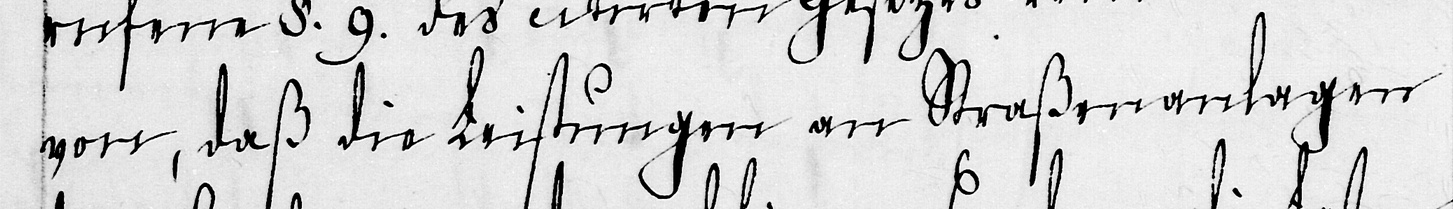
von, daß die Leistungen an Straßenanlagen
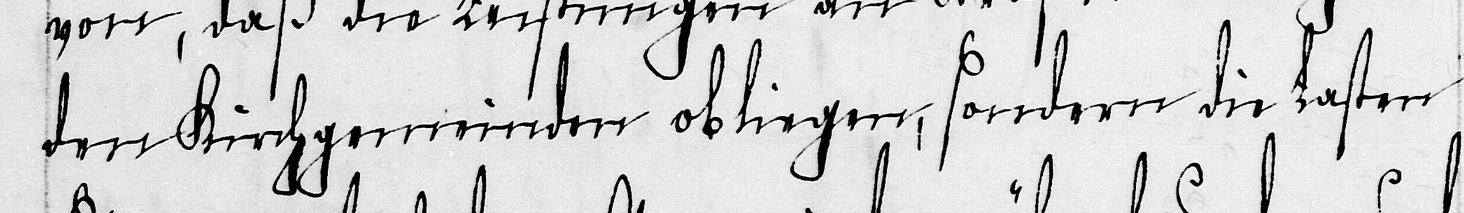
den Kirchgemeinden obliegen, sondern die Lasten
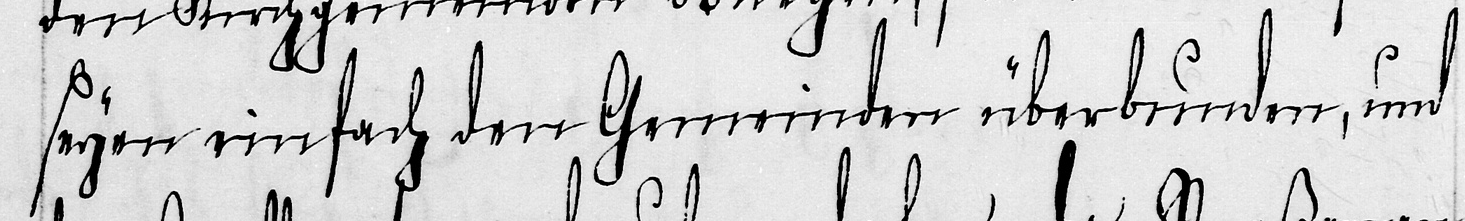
seyen einfach den Gemeinden überbunden, und
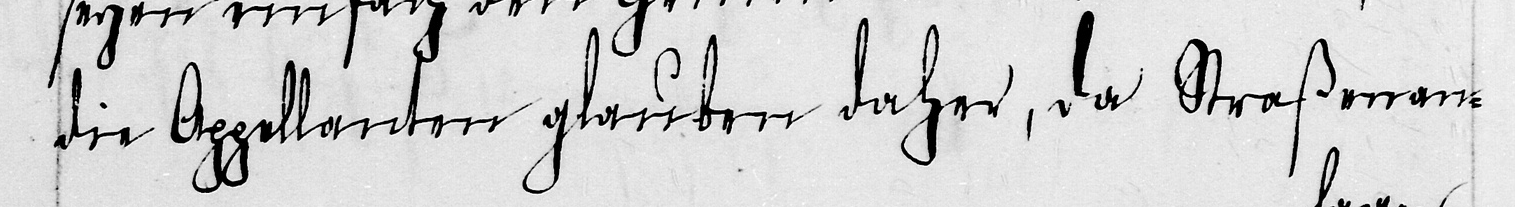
die Appellanten glauben daher, da Straßenan-
